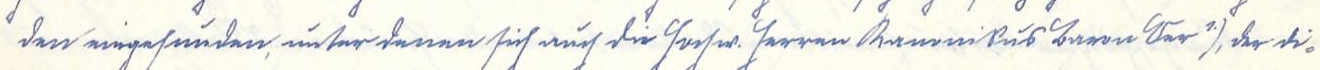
den eingefunden, unter denen sich auch die hochw. Herren Kanonikus Baron Aer 1), der Di-
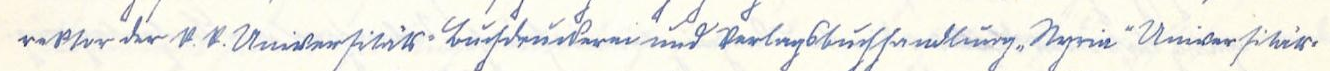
rektor der k. k. UniversitätsBuchdruckerei und Verlagsbuchhandlung „Styria“, Universitäts-
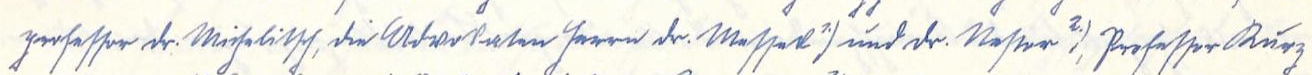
professor Dr. Michelitsch, die Advokaten Herrn Dr. MesseK 1) und Dr. Nestor, Professor Kurz
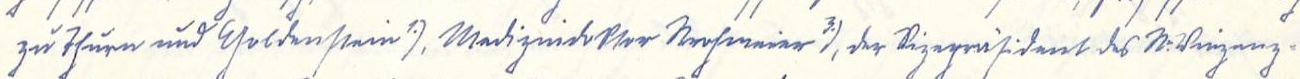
zu Thurn und Goldenstein, 1), Medizinidoktor Dr. Strohmaier 3), der Vizepräsident des St Vinzenz-
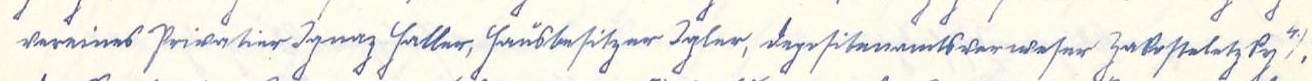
vereins Privatier Ignaz Haller, Hausbesitzer Igler, Depositenamtsverweser Zukosteletzky 4)
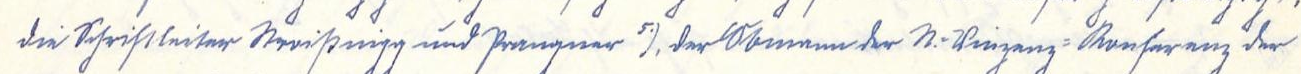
die Schriftleiter Stroißnigg und Pranger 5). Der Obmann der St. Vinzenz-Konferenz der
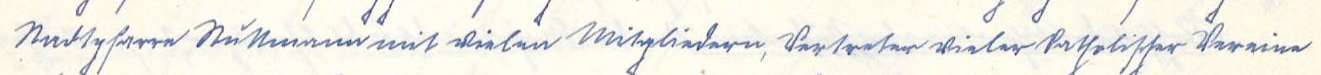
Stadtpfarre Stuttmann mit vielen Mitgliedern, Vertreter vieler katholischer Vereine
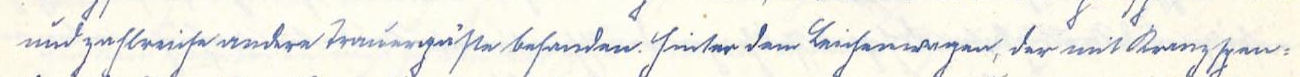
und zahlreiche andere Trauergäste befanden. Hinter dem Leichenwagen, der mit Kranzspen-
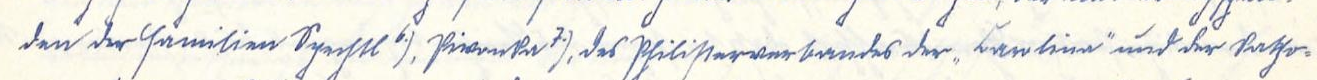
den der Familien Spechtl 6), Pirenker 7), des Philisterverbandes der „Carolina“ und der katho-
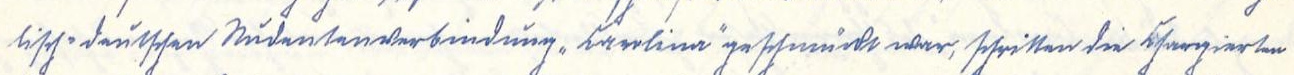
lisch deutschen Studentenverbindung „Carolina“ geschmückt war, schritten die Chargierten
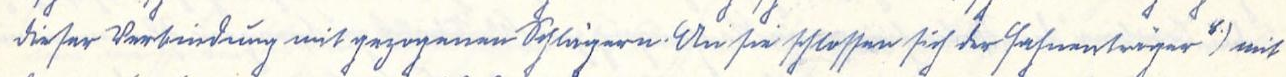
dieser Verbindung mit gezogenen Schlägern. An sie schlossen sich der Fahnenträger 8) mit
